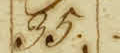35.
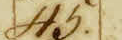45.
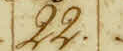22.
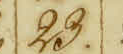23.
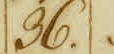36.
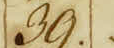39.
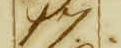17.
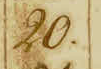20.
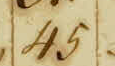45.
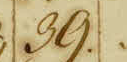39.
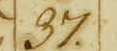37.
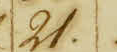21.
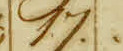17.
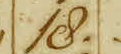18.
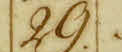29.
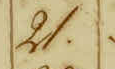21.
